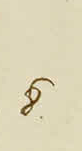8.
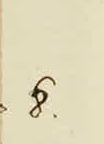8.
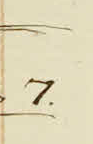7.
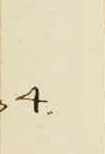4.
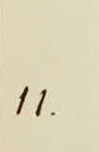11.
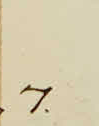7.
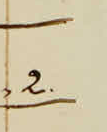2.
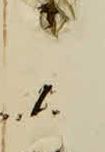1.
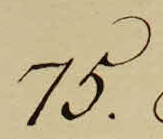75.
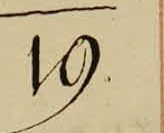19.
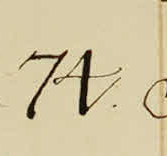74.
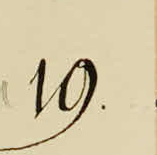19.
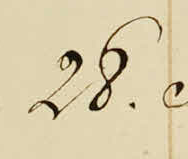28.
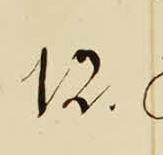12.
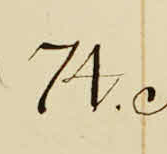74.
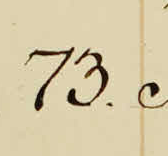73.
